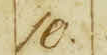10.
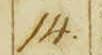14.
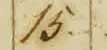15.
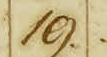19.
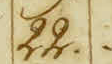22.
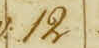12.
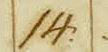14.
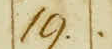19.
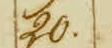20.
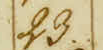23.
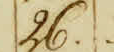26.
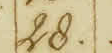28.
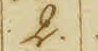2.
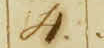4.
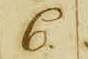6.
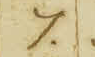7.
